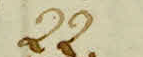22.
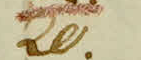20.
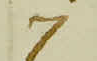7
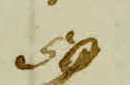59
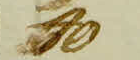40
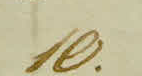10.
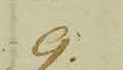9.
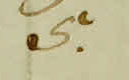5.
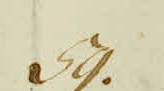59.
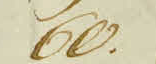60.
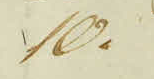10.
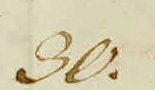30.
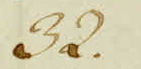32.
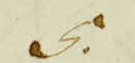5.
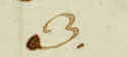3.
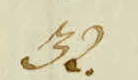32.
